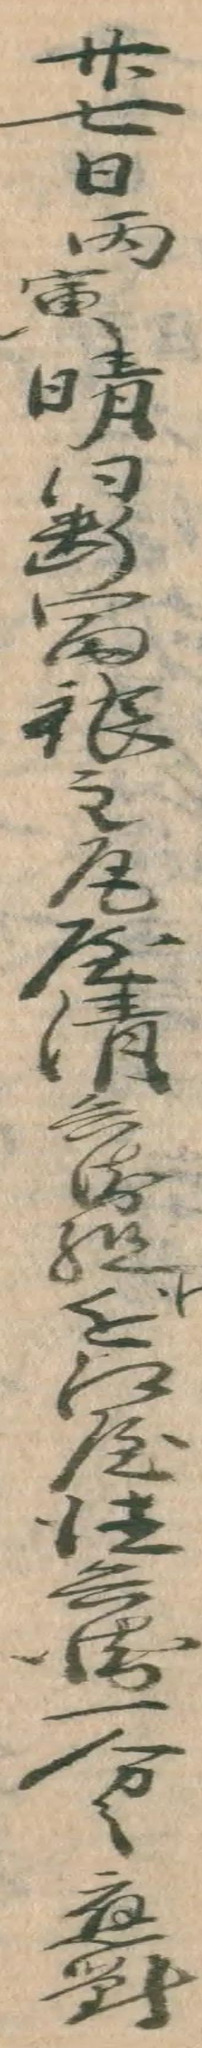廿七日丙寅晴同断富銀主丸屋清兵衛組代近江屋徳兵衛一分之応對
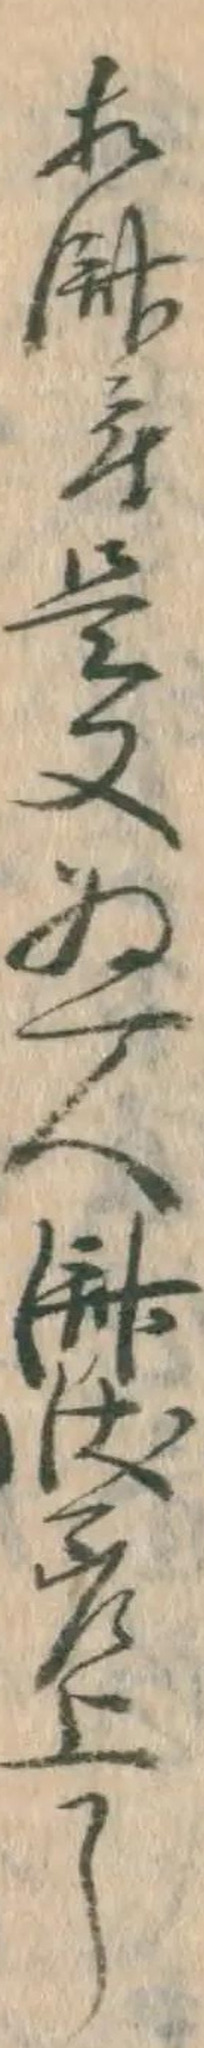相済ニ付是又為一人済状差上了
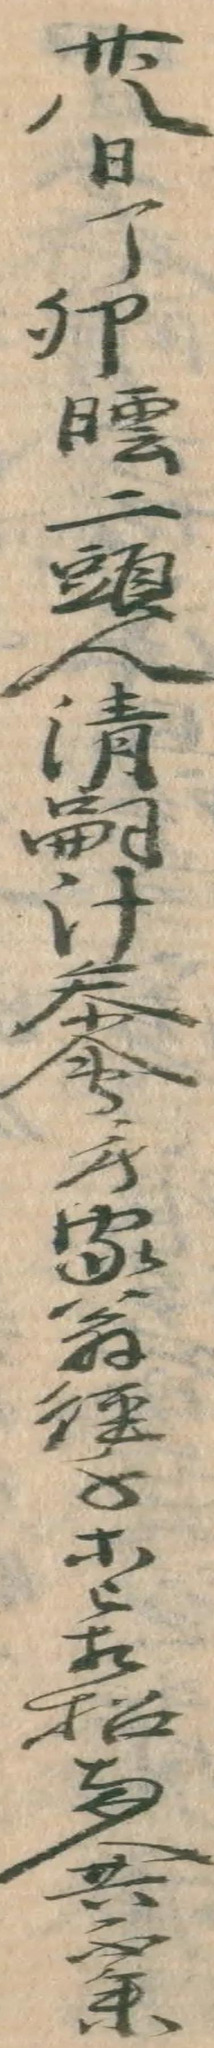廿八日丁卯曇二頭人清嗣汁参會ニ付家翁経千等被相招両人共不参
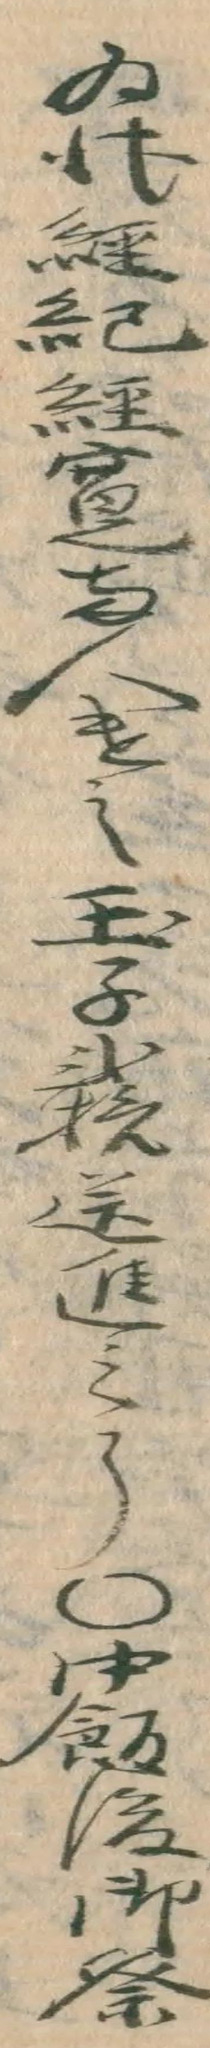為代経紀経寛両人遣之玉子弐拾送進之了○中飯後御祭
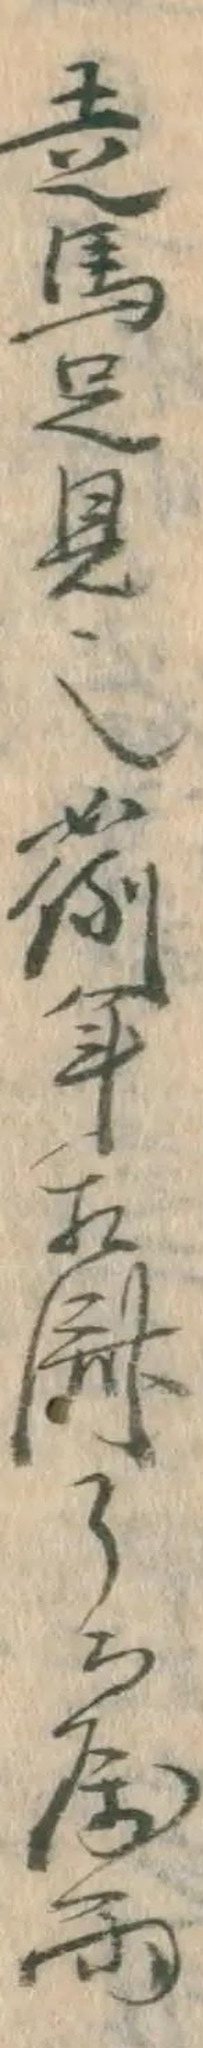走馬足見也如例年相済了而属雨
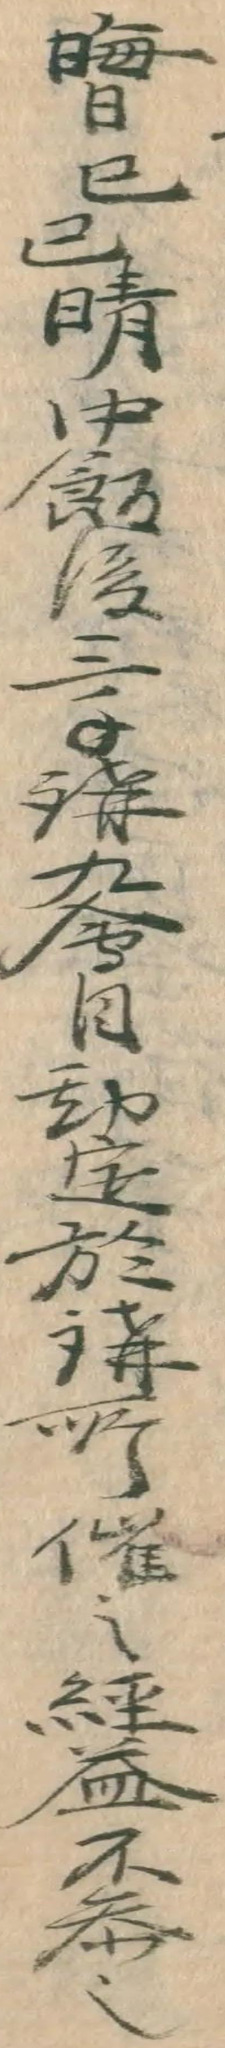晦日己巳晴中飯後三手講九會目勘定於講所催之経益不参也
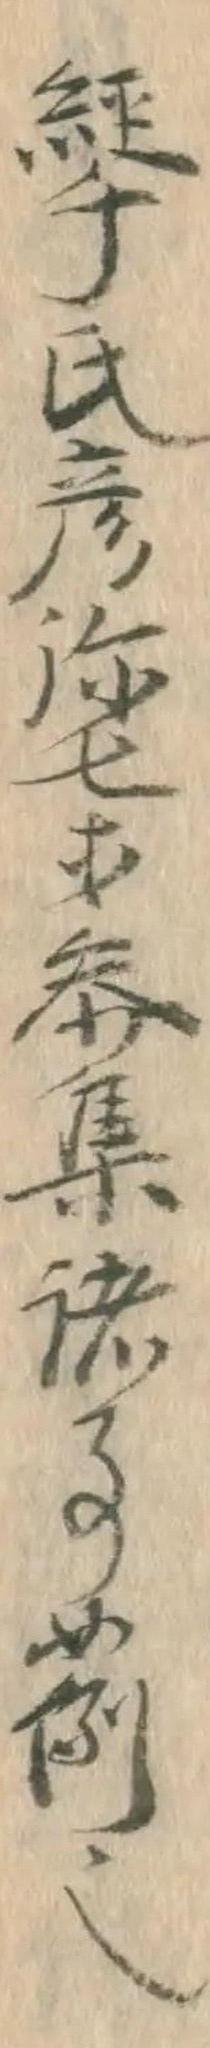経千氏彦弥七も参集諸事如例也

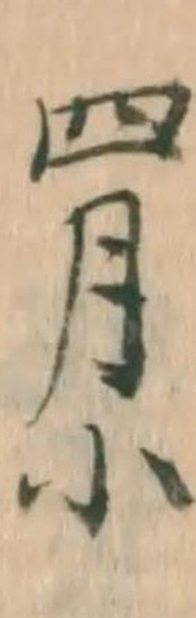四月小
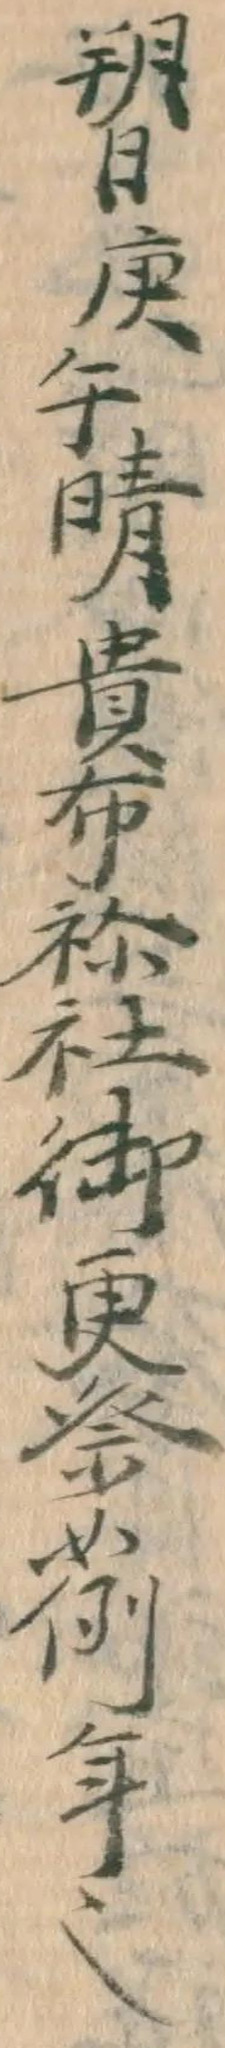朔日庚午晴貴布祢社御更祭如例年也
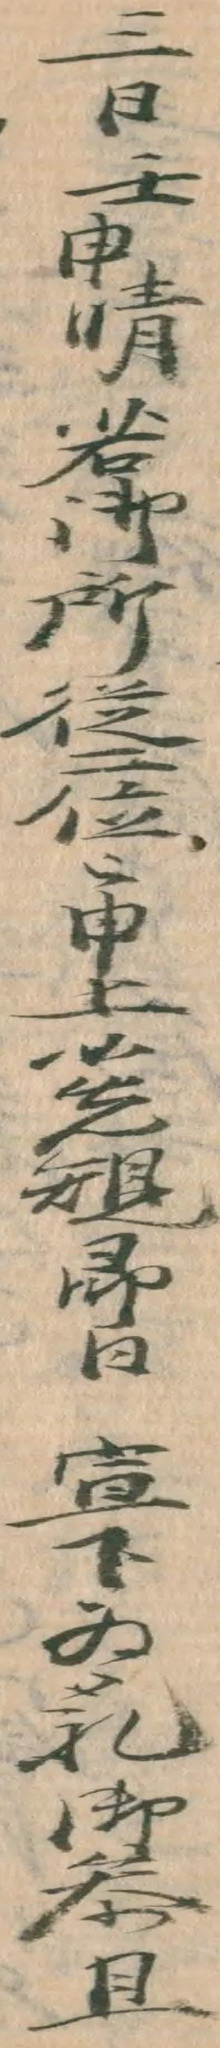三日壬申晴若御所従二位被申上如先規即日宣下為御礼御参且
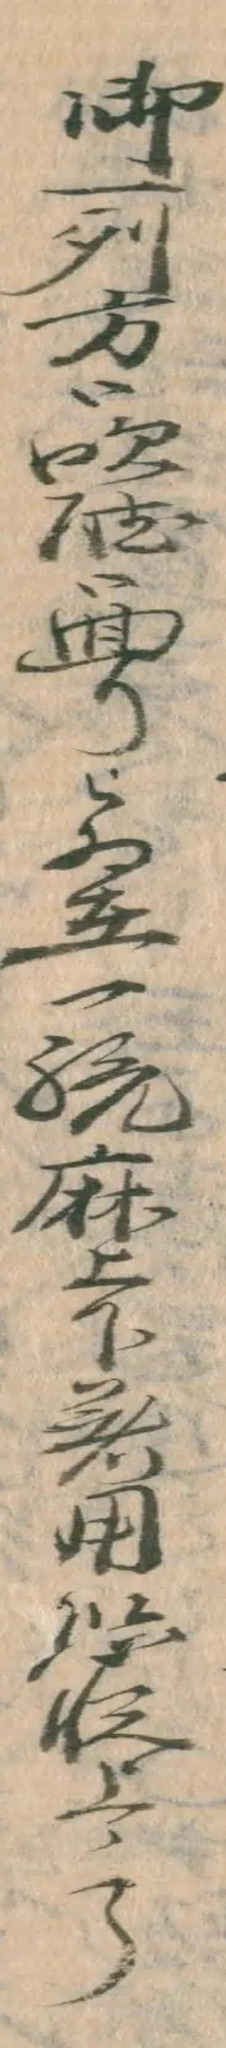御一列方御吹聴御回り被為在一統麻上下着用恐悦上候了
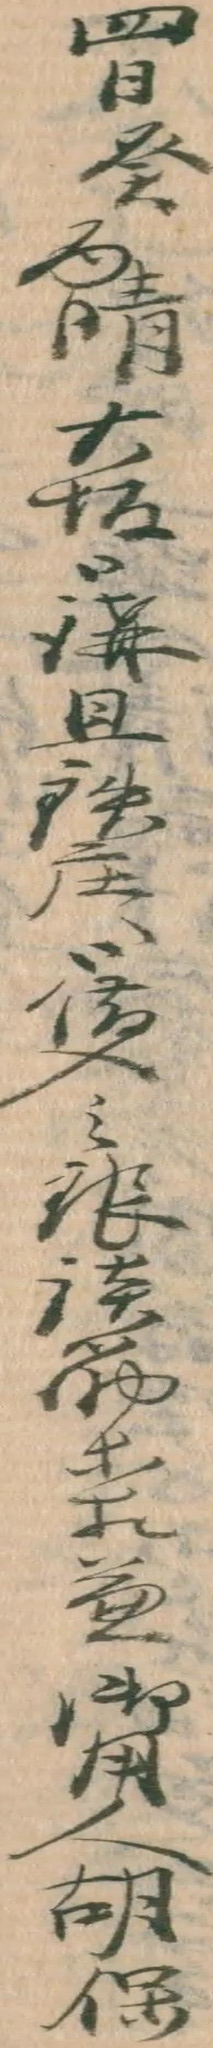四日癸酉晴大坂御講且鉄庄へ御借入之銀談筋等相兼御用人胡保
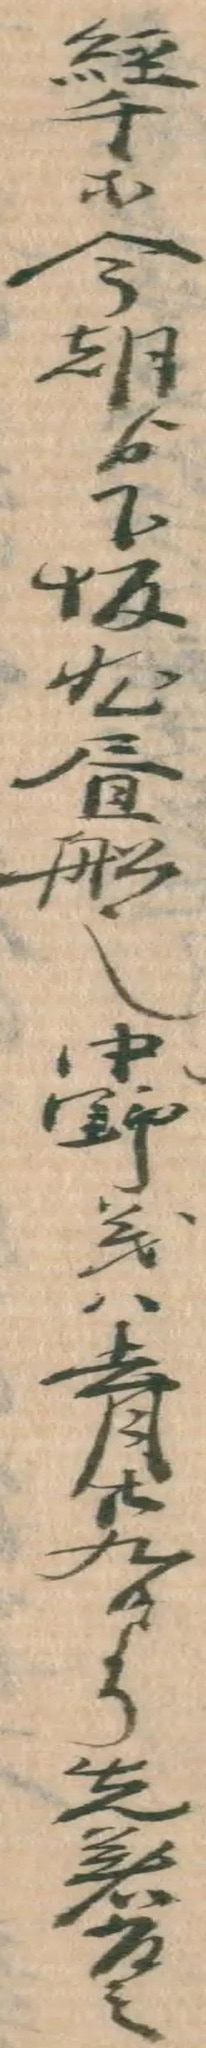経千等今朝ゟ下坂尤昼舩也中野義ハ去月廿九日より先暑有之
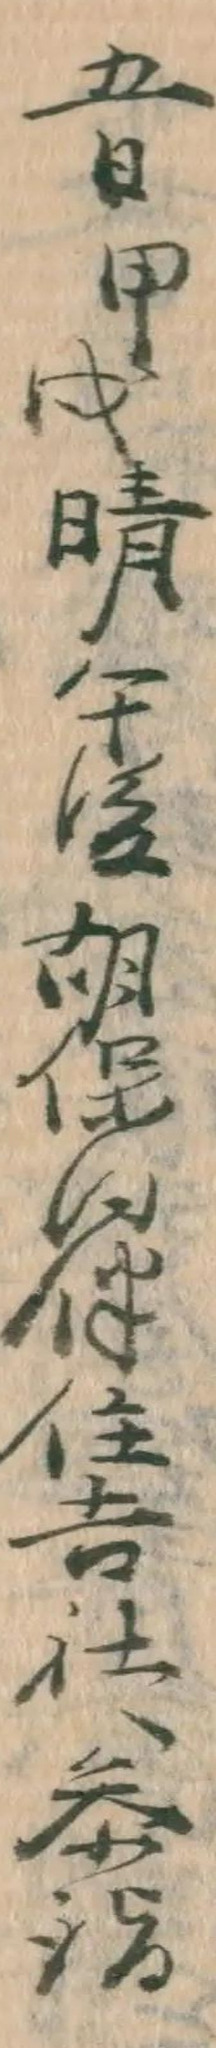五日甲戌晴午後胡保同伴住吉社へ参詣
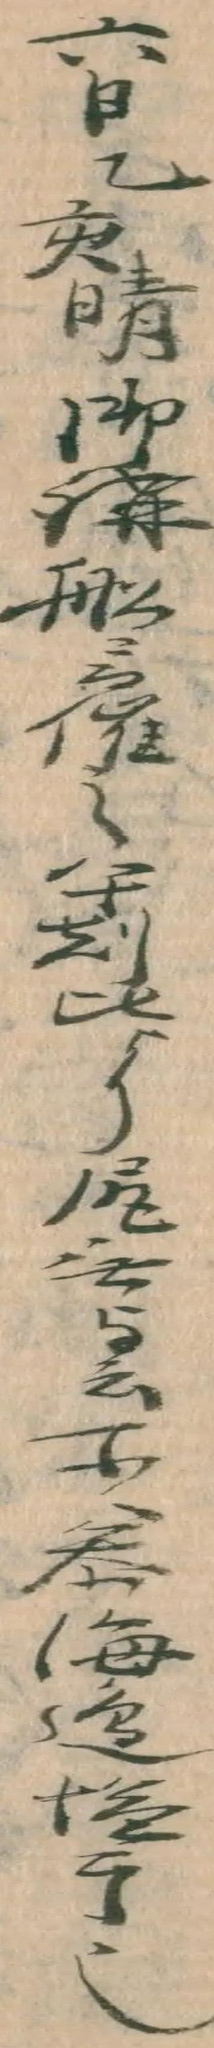六日乙亥晴御講船ニ而催之午刻比より尻無と云所へ泰海邊塩干也
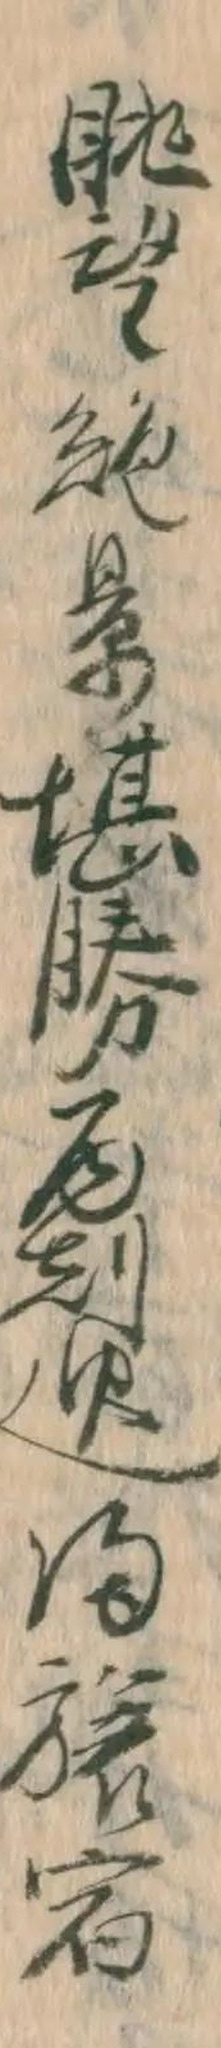眺望絶景堪勝酉刻過帰旅宿
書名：賀茂社記録. 第65冊
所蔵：国立国会図書館 National Diet Library, JAPAN
